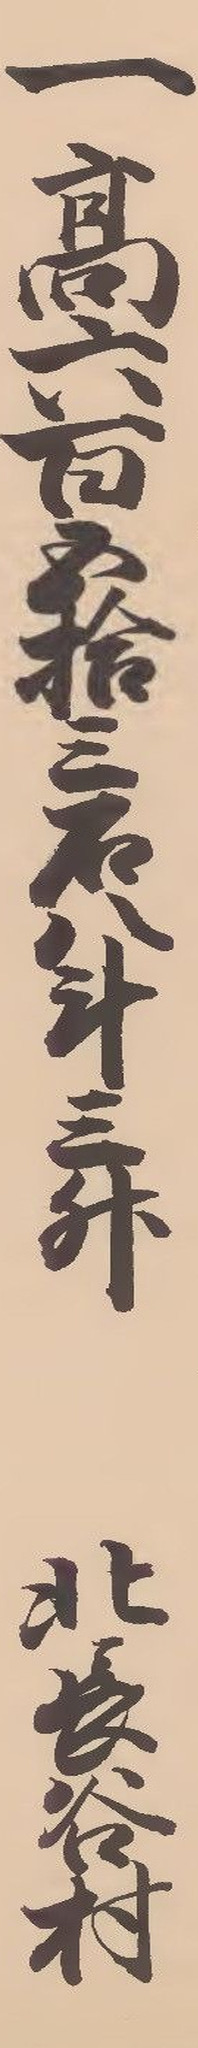一高六百五拾三石八斗三升北長谷村
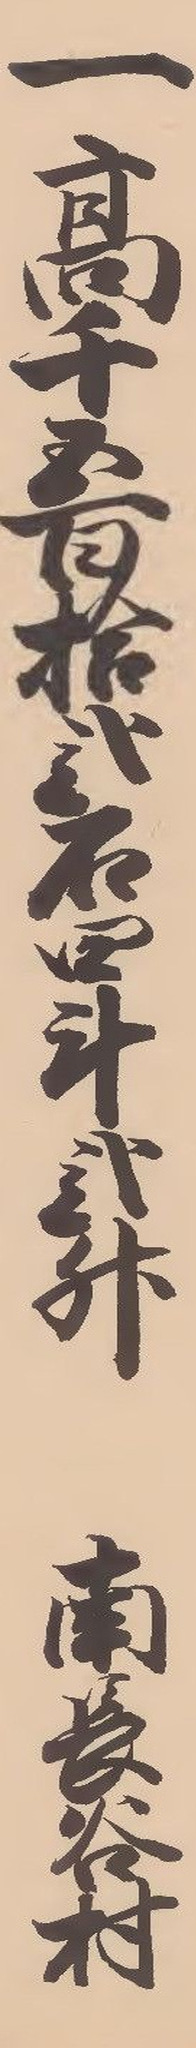一高千五百拾弐石四斗弐升南長谷村
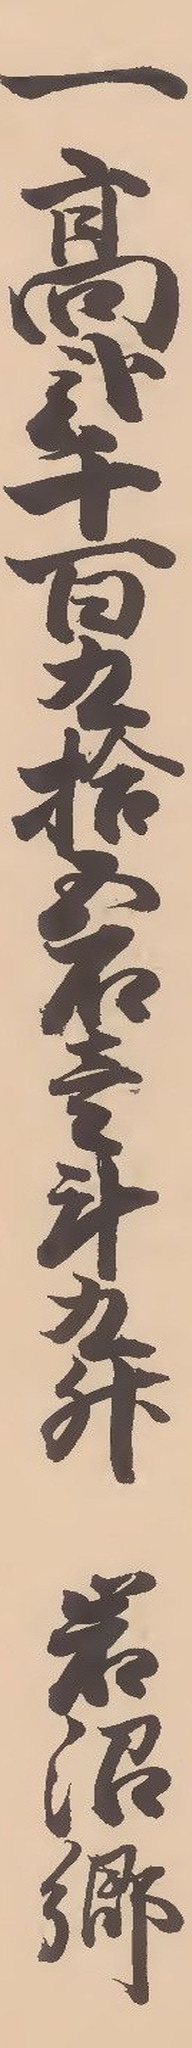一高弐千百九拾五石壱斗九升岩沼郷

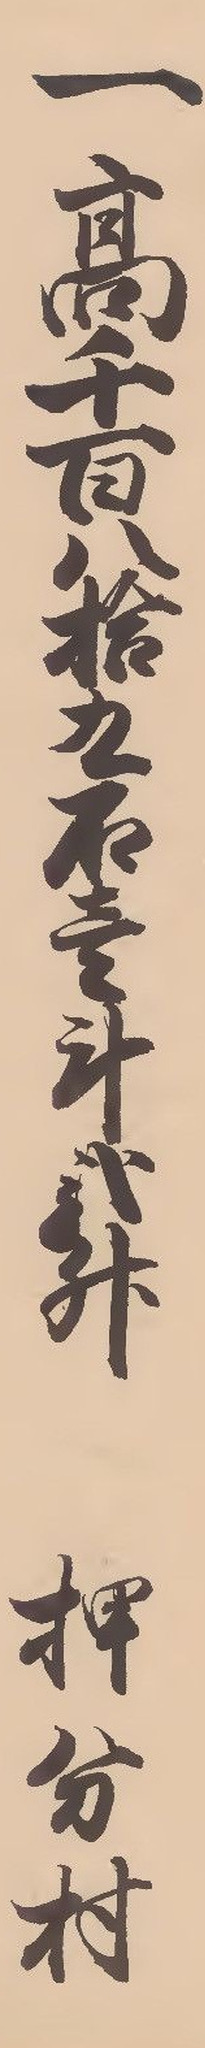一高千百八拾九石壱斗弐升押分村
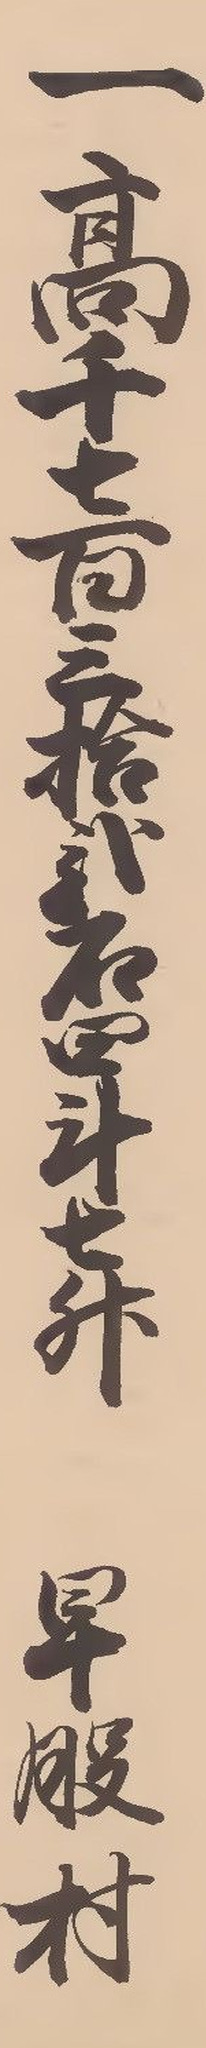一高千七百三拾弐石四斗七升早股村
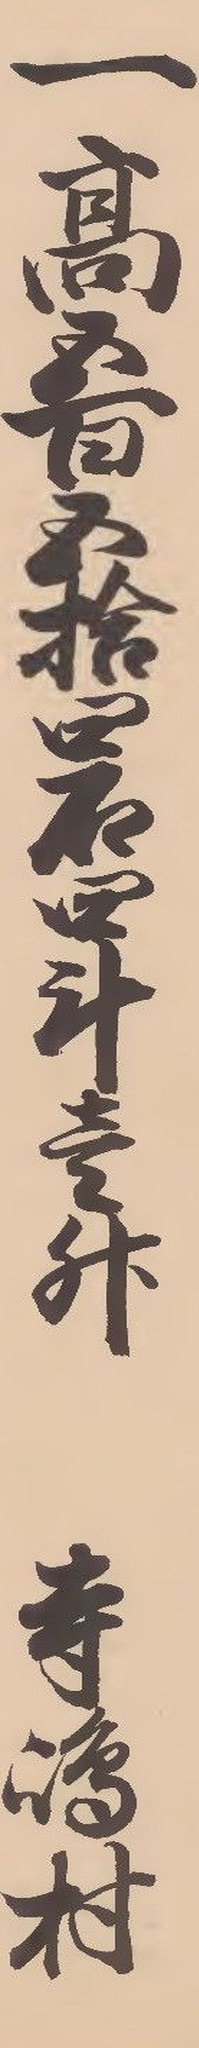一高五百五拾四石四斗壱升寺島村
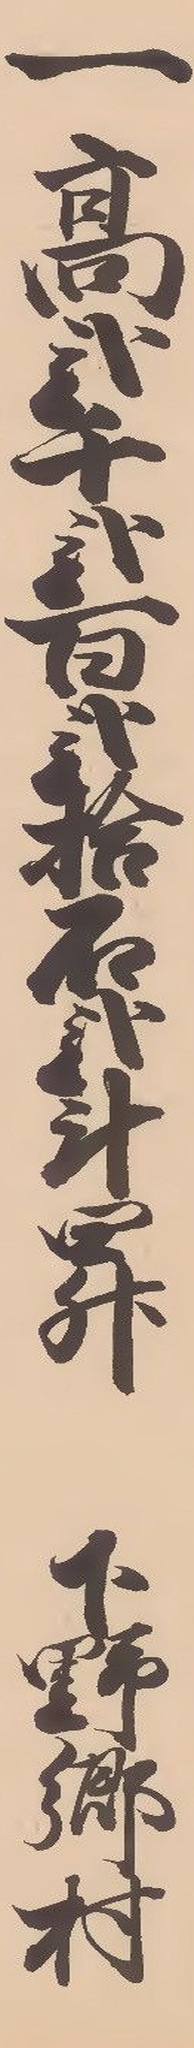一高弐千弐百弐拾石弐斗四升下野郷村
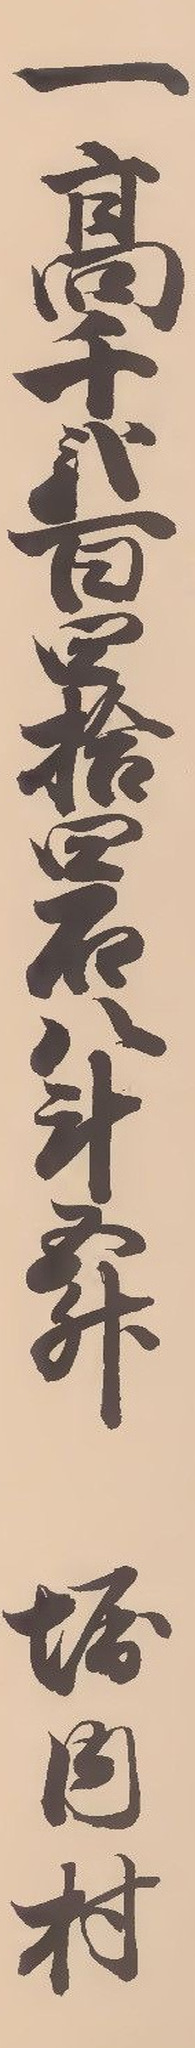一高千弐百四拾四石八斗五升堀内村
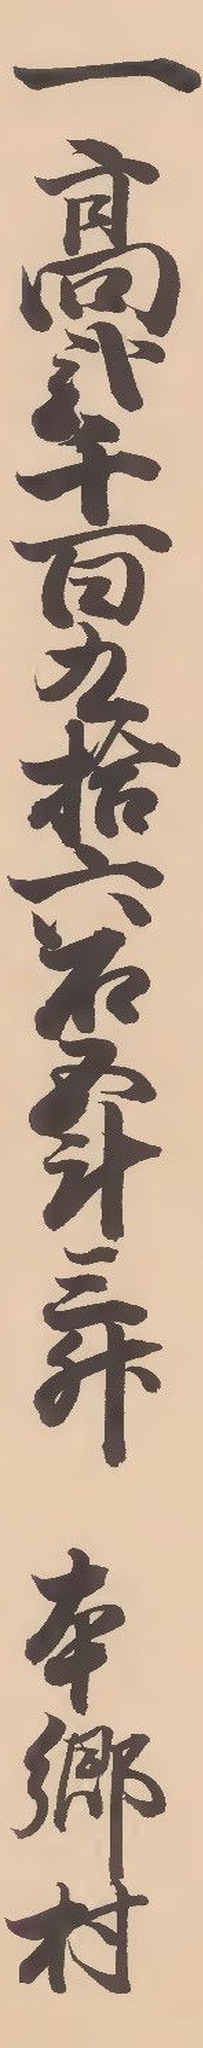一高弐千百九拾六石五斗三升本郷村
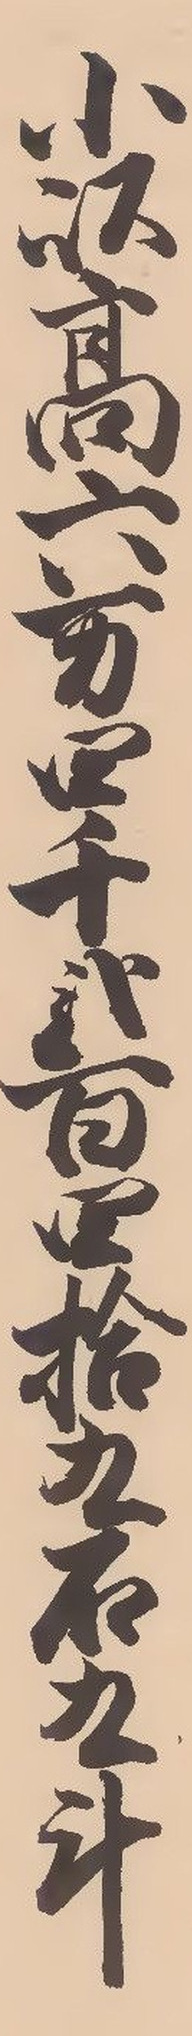小以高六万四千弐百四拾九石九斗

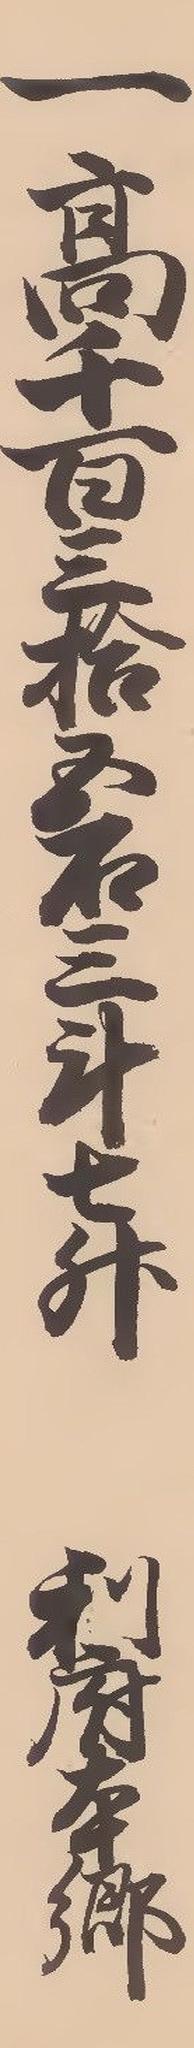一高千百三拾五石三斗七升利府本郷
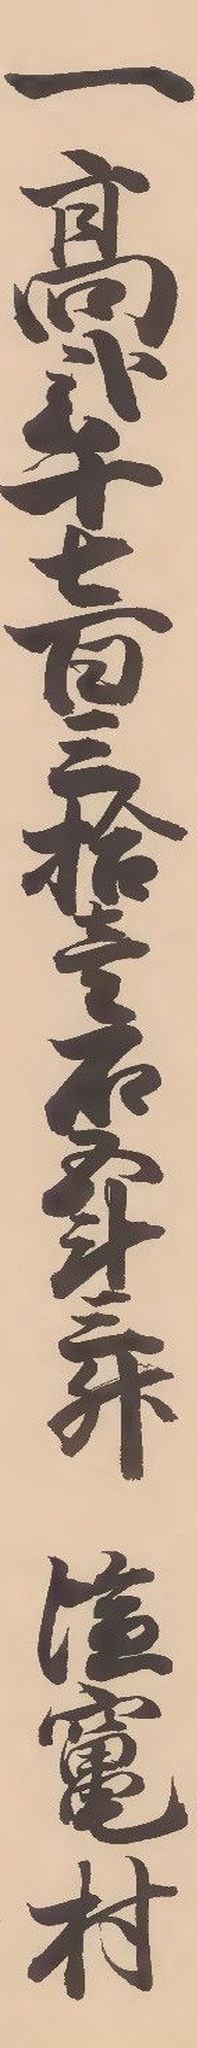一高弐千七百三拾壱石五斗三升塩竃村
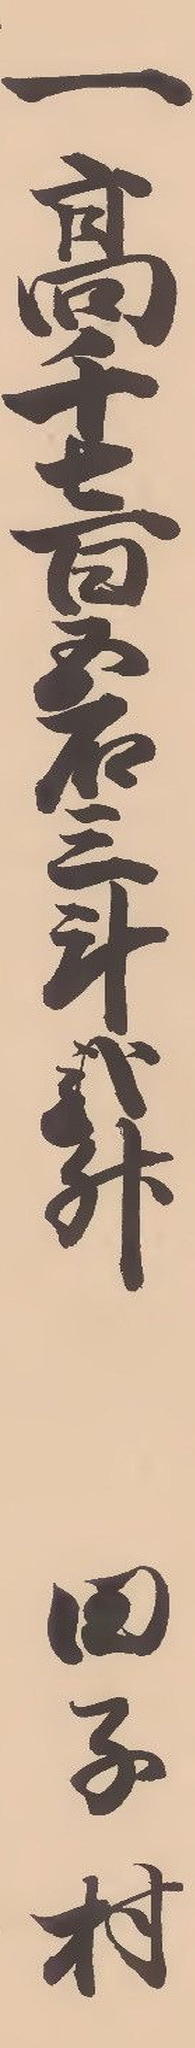一高千七百五石三斗弐升田子村
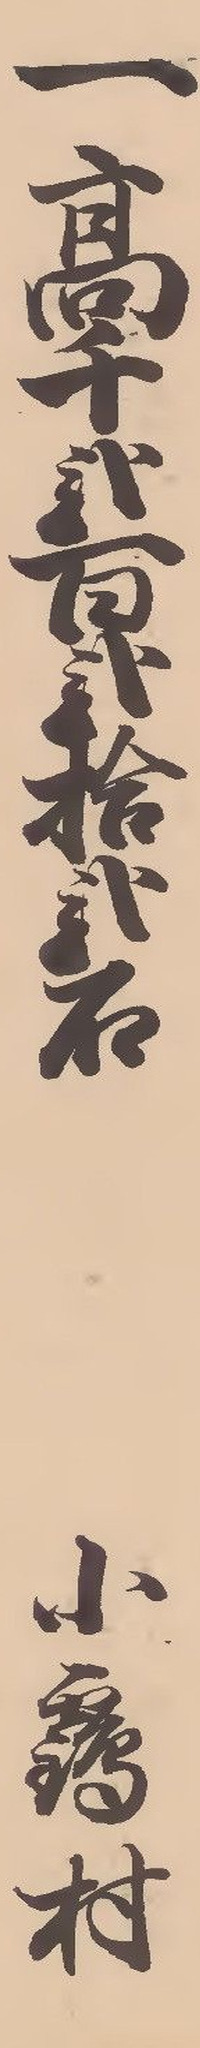一高千弐百弐拾弐石小鶴村
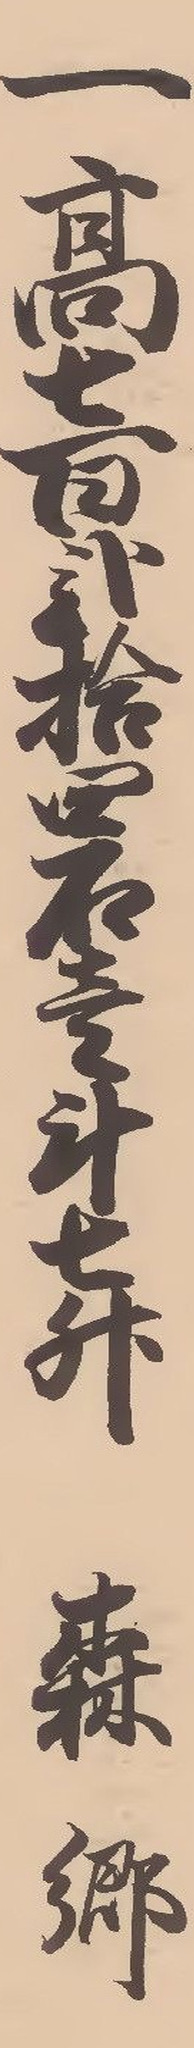一高七百弐拾四石壱斗七升森郷
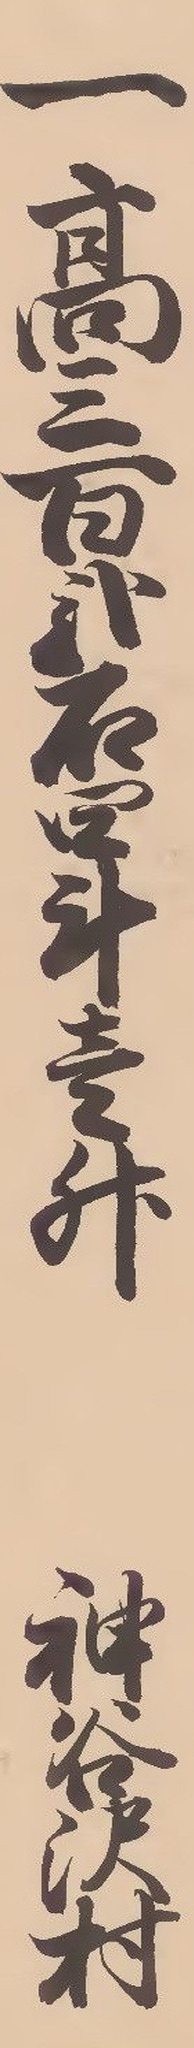一高三百弐石四斗壱升神谷沢村
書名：陸奥国郷帳　５
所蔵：国立公文書館 National Archives of Japan
